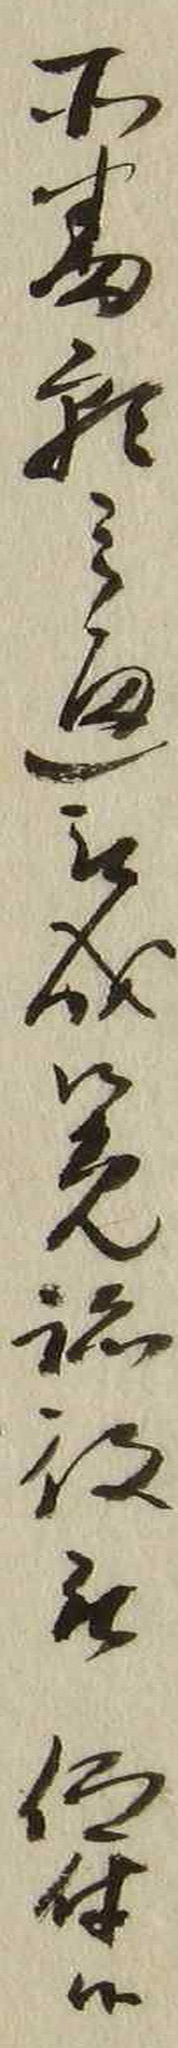所番願之通被成御免跡役被仰付候
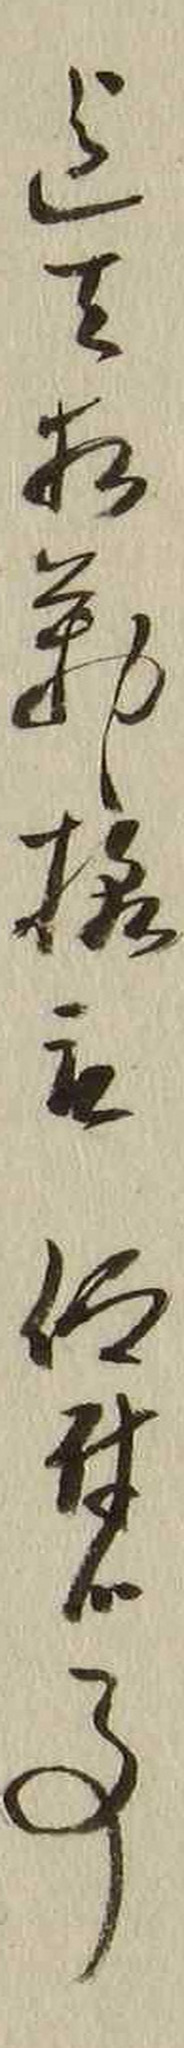迄は相勤候様被仰付候事
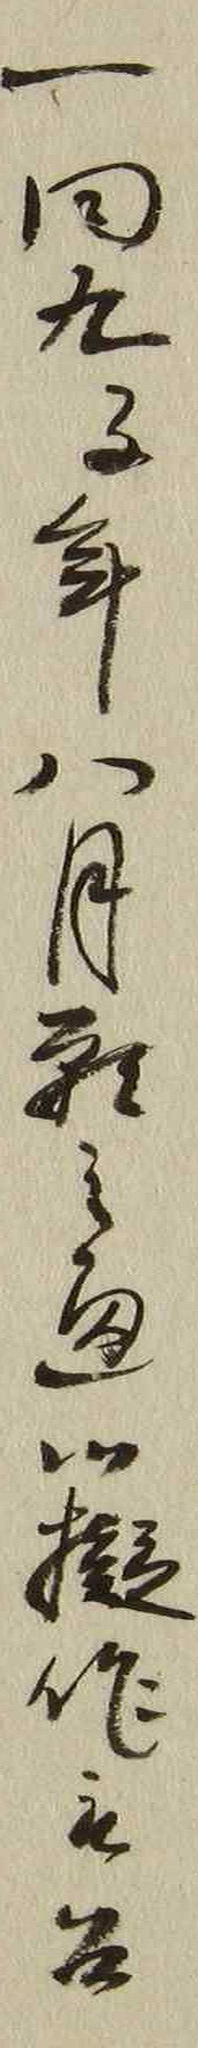一同九子年八月願之通御擬作被召
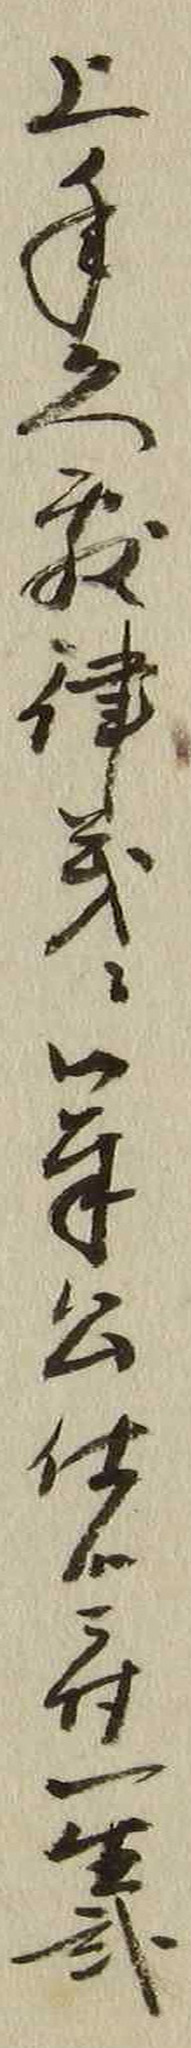上年久敷律義に御奉公仕候に付一生弐
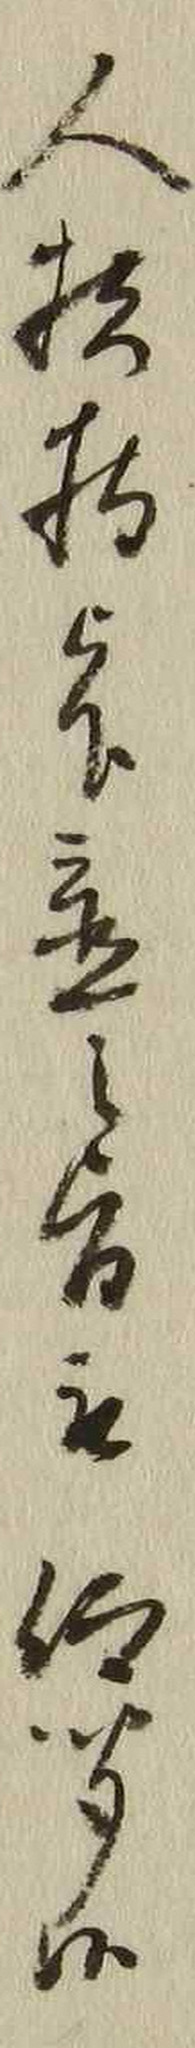人扶持被下置之旨被仰聞候
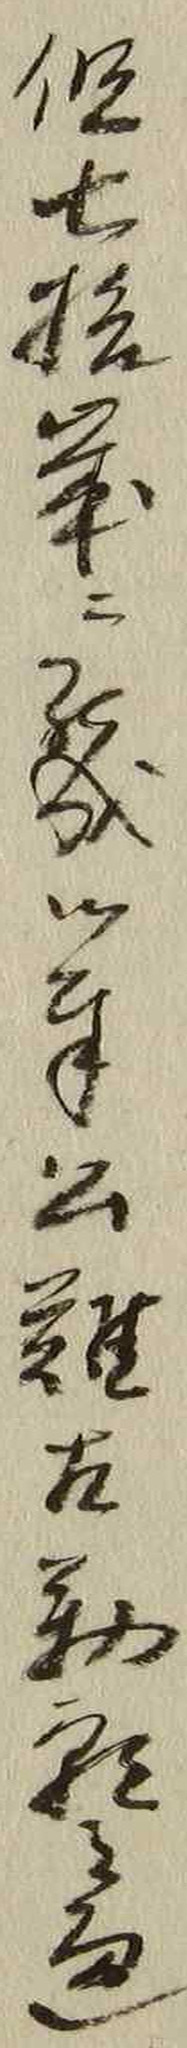但七拾歳に罷成御奉公難相勤願之通
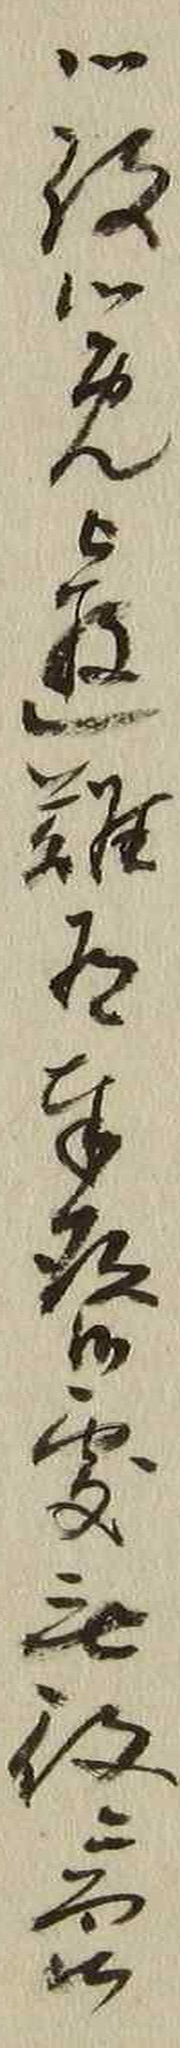御役御免被遊難有奉存候処無役に而御
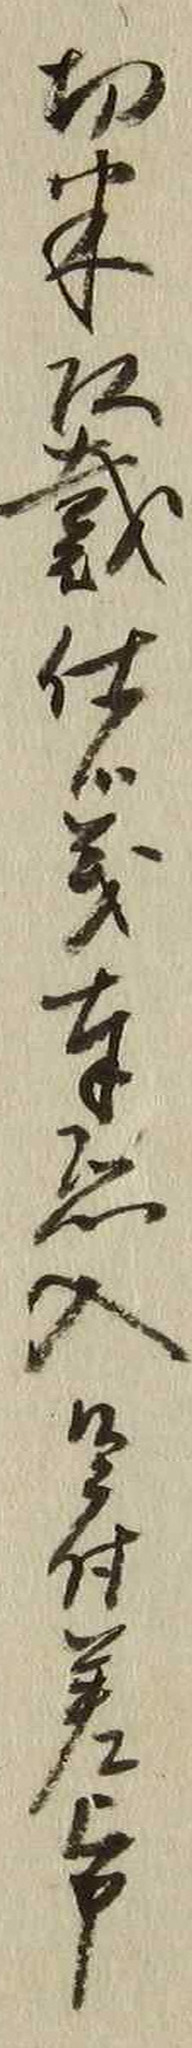切米頂戴仕候義奉恐入候に付差上申
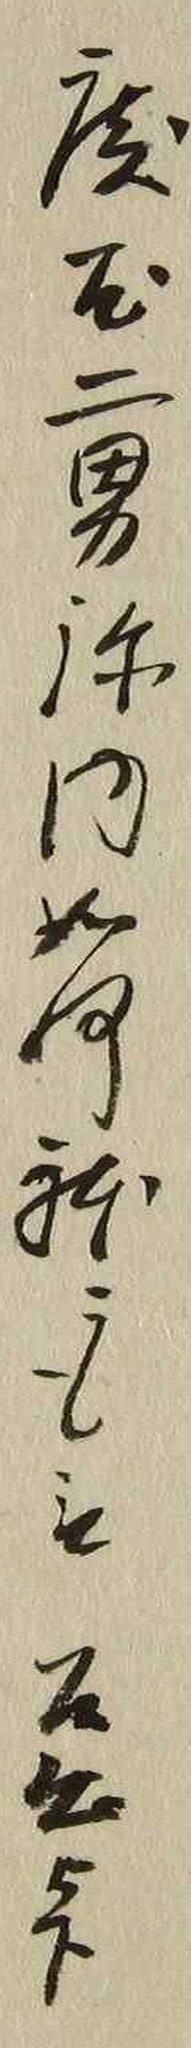度尤弐男弥内如何体にも被召出被下
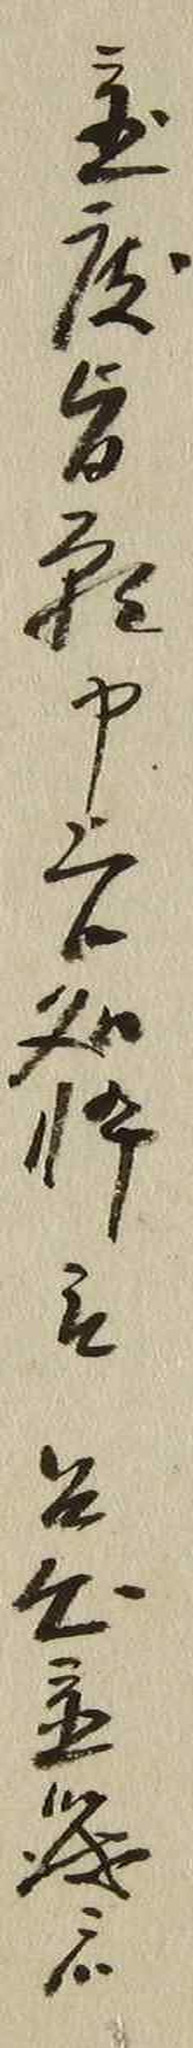置度旨願申上候処忰被召出置候儀に候
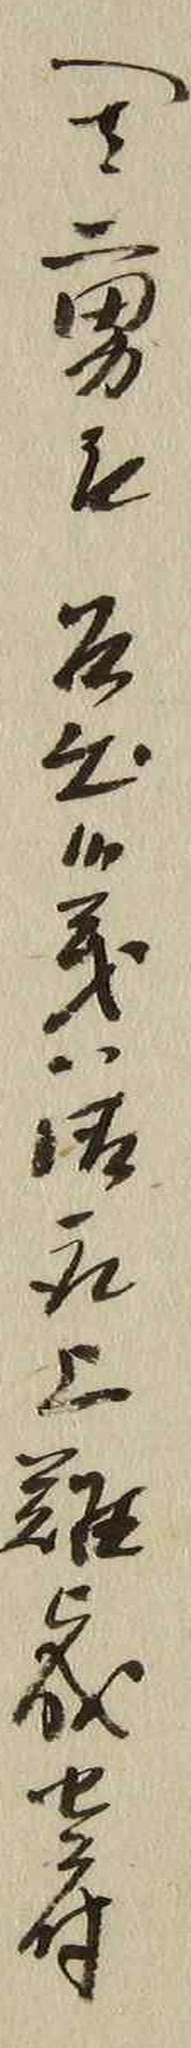へは二男被召出候義は御取上難被成由に付
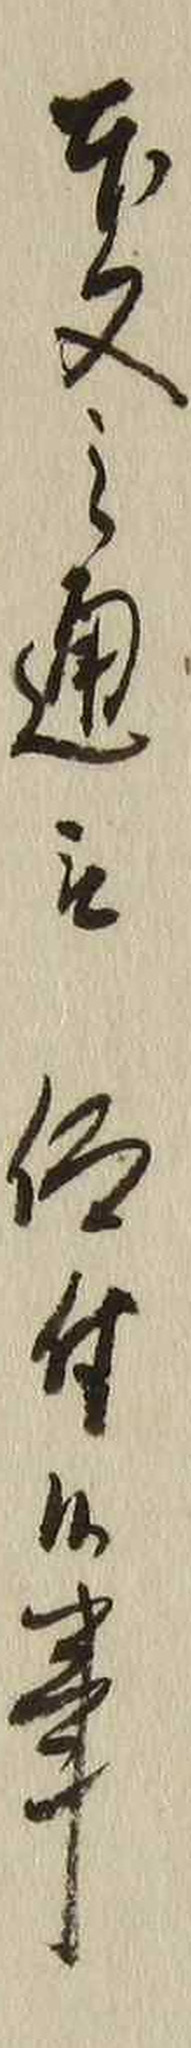本文之通被仰付候事
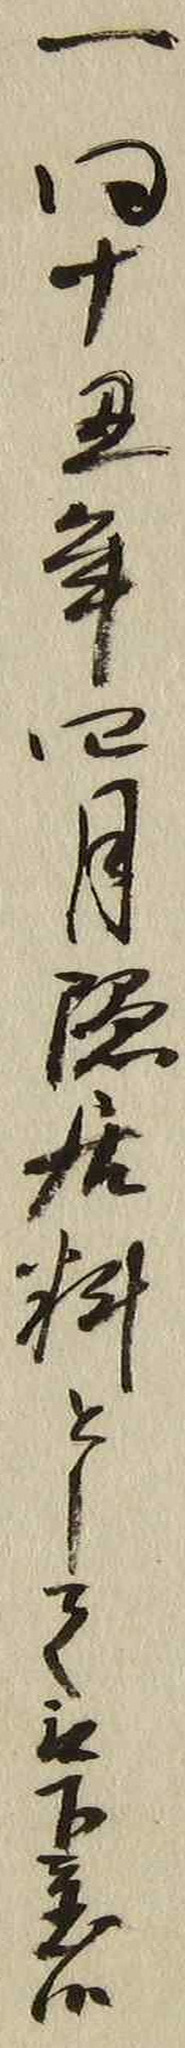一同十五丑年四月隠居料として被下置候
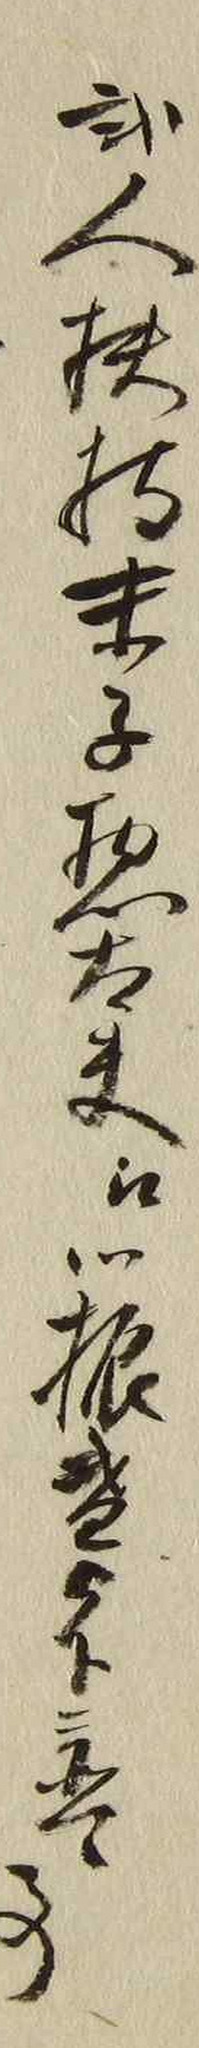弐人扶持末子惣太夫江御振替被下置候事
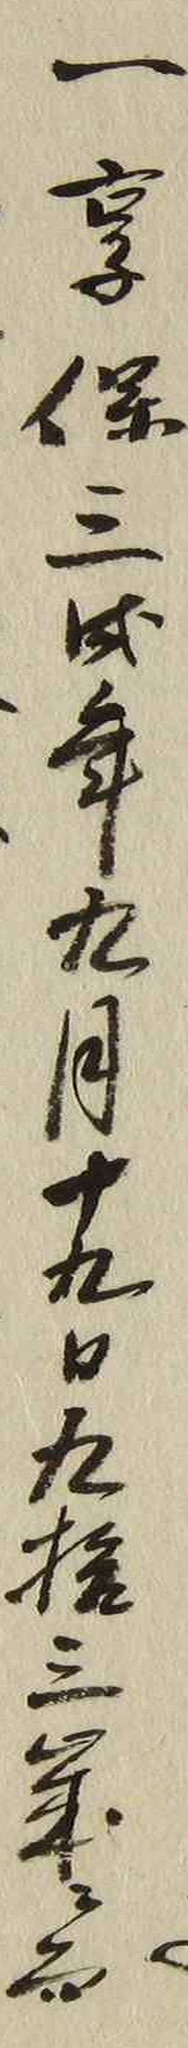一享保三戌年九月十九日九拾三歳に而
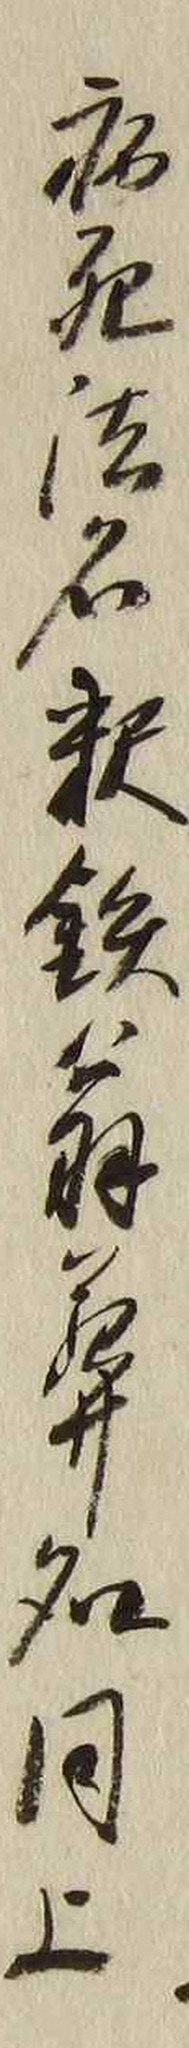病死法名釈鉄翁葬処同上
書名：諸士系譜　巻之360　す之部10
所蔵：会津若松市立会津図書館
